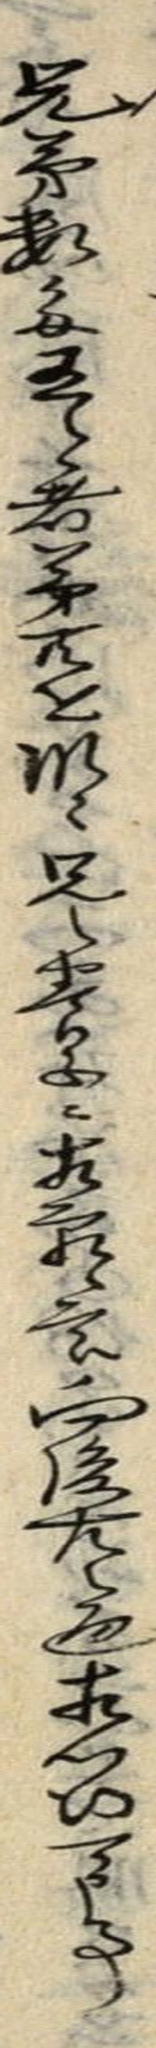兄弟数多有之候者弟共を段々兄之養子に相願候節向後左之通相心得可申事
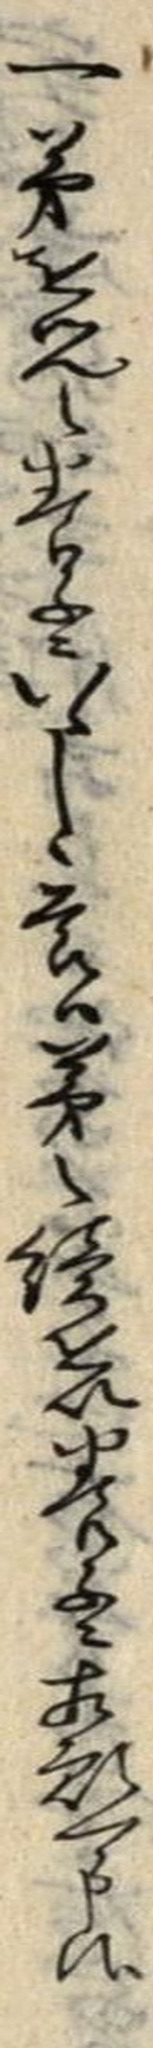一弟を兄之養子にいたし候節は弟之続を以養子に相願可申候
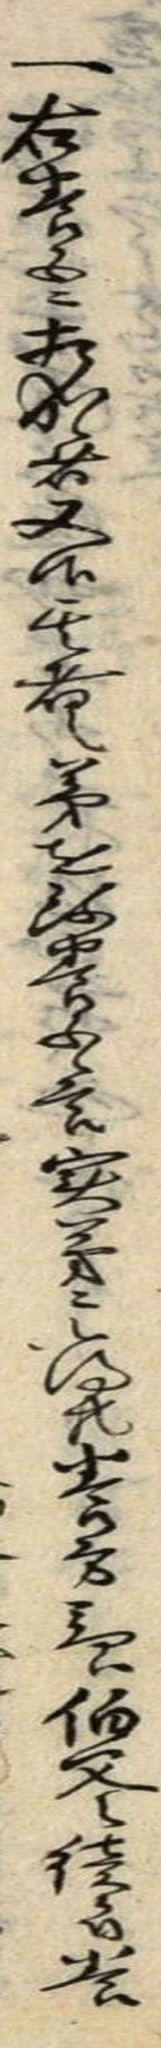一右養子に相成候者又候其者之弟を致養子候節実弟に候得共養方に而は伯父之続に付養
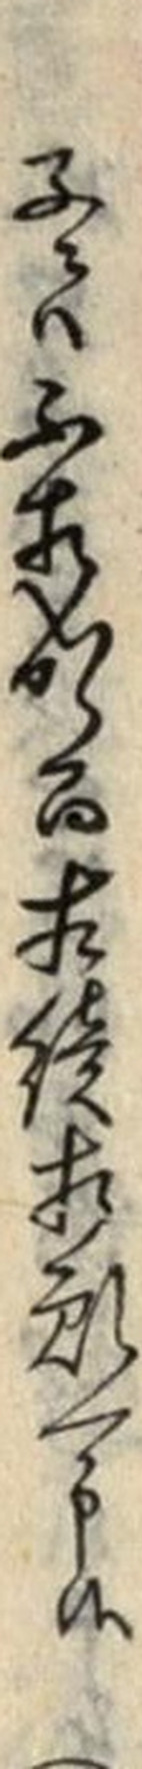子には不相成候間相続相願可申候
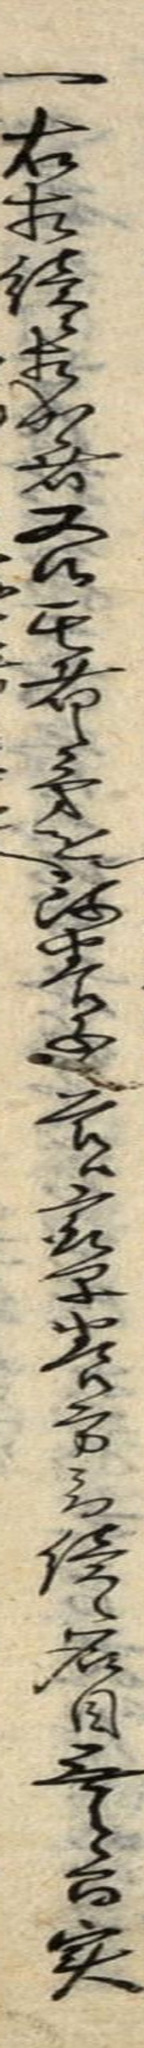一右相続に相成候者又候其者の弟を致養子候節は最早養方に而続之名目無之候間実
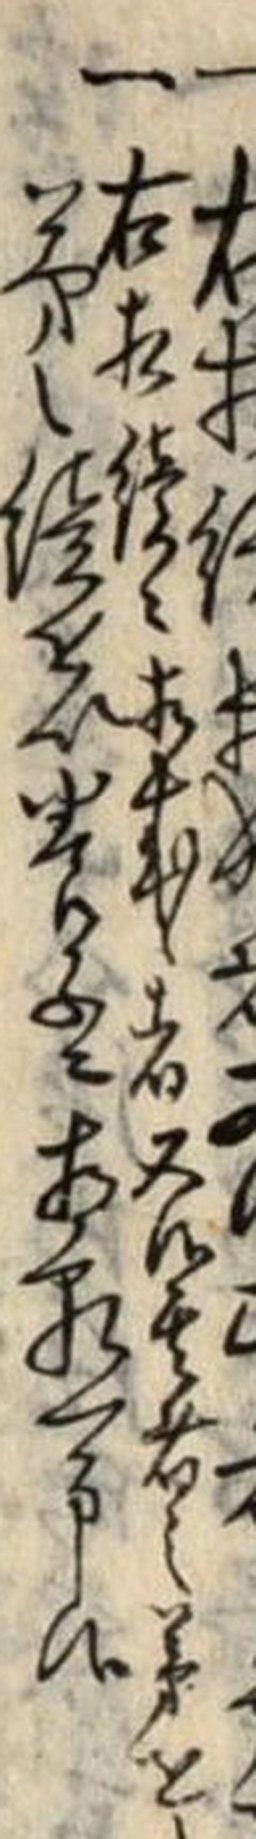弟之続を以養子に相願可申候
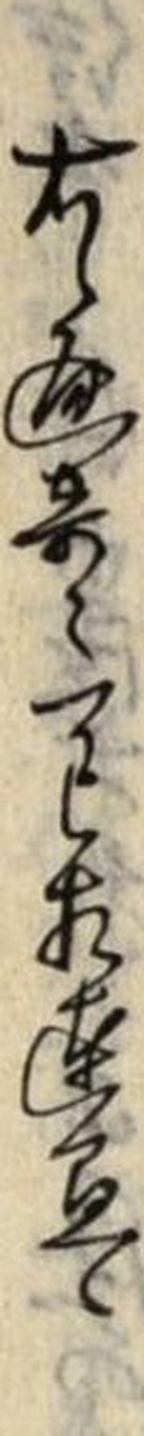右之通寄々可被相達置候

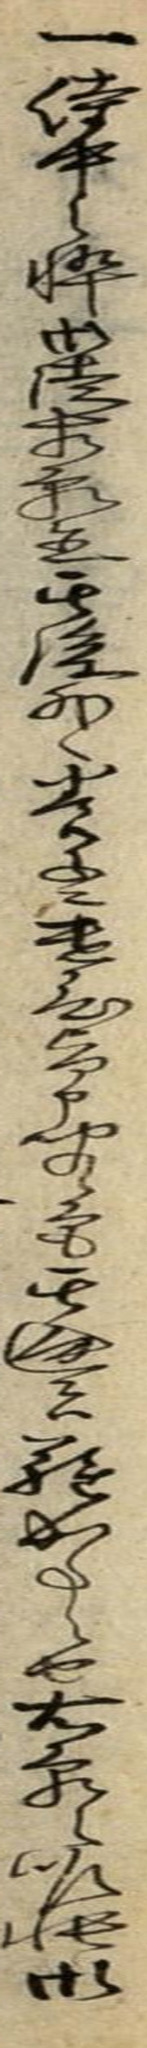一侍中之悴御徒相願置其後外へ養子ニ遣度旨申聞候而も其通ニハ難成事之由右願之順帳御
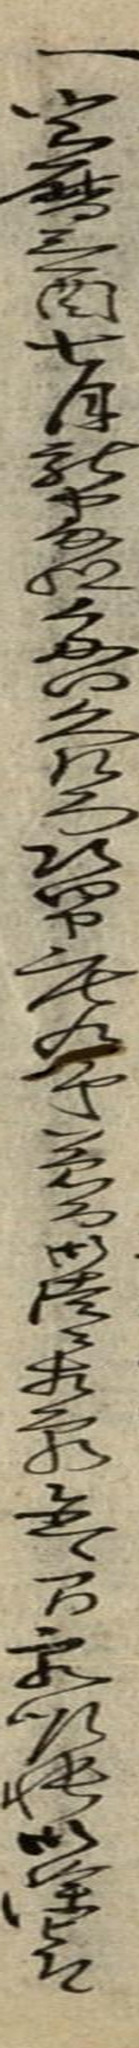一宝暦三酉七月新番組多田久左衛門次男庄九郎兼而御徒に相願置候間願順帳御除被下候
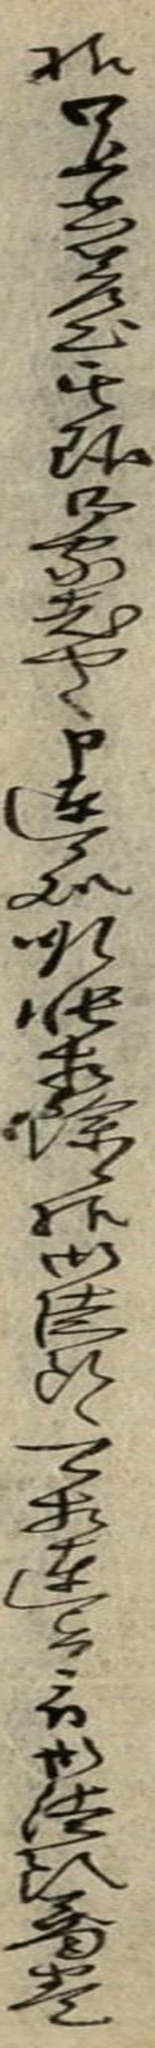様口上書差出其趣御家老中へ申達候処順帳相除候様御徒頭へ可相達旨ニ付御徒頭葛巻
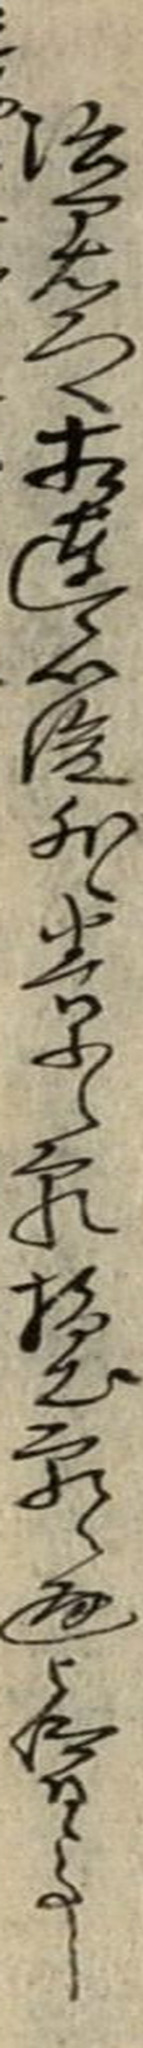治部右衛門へ相達候以後外へ養子之願指出願之通被仰付候事
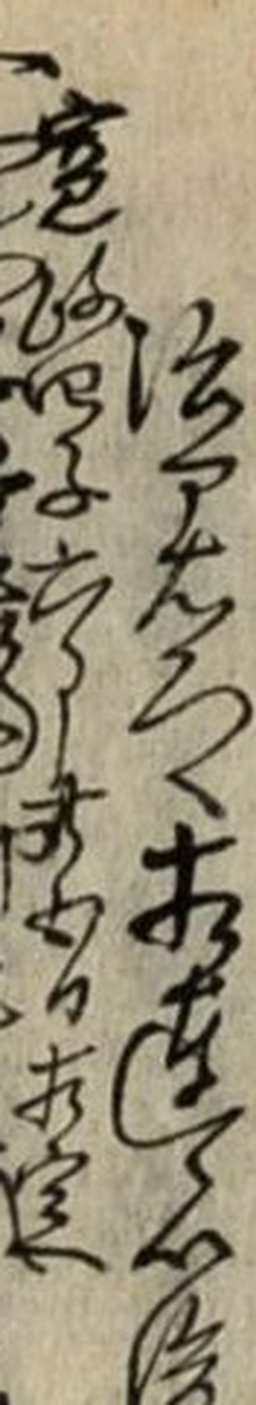寛政四子六月廿五日相定
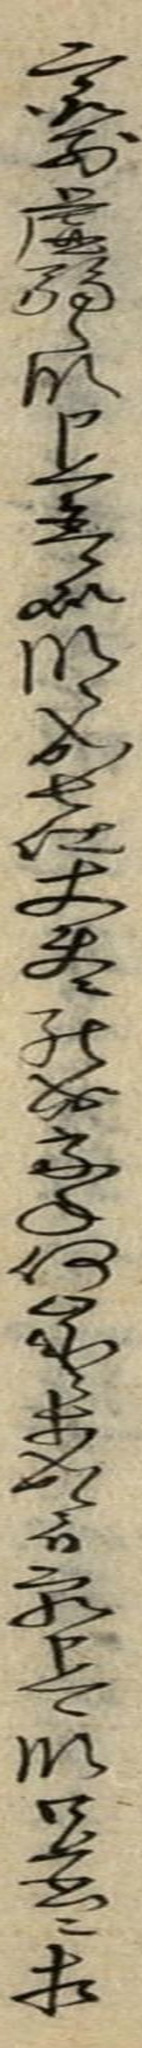最前虚弱之段申上置候処段々成長仕丈夫に罷成当年何歳に相成候に付願申上候段口上書に相
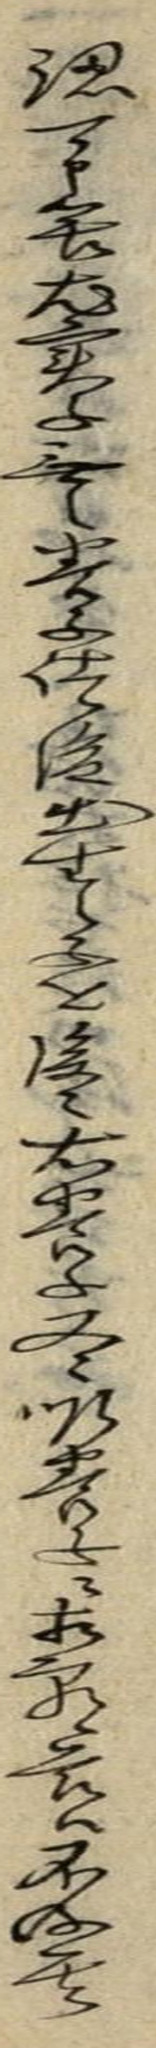認可申筈尤実子無之養子仕候後出生之子を後々右養子又々順養子に相願候節は不及其
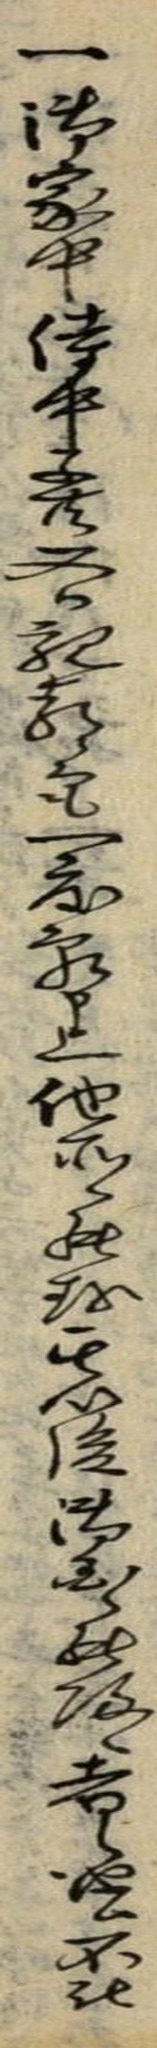一御家中侍中子共又は親類に而も一度願申上他所へ罷越其以後御国へ罷帰候者之儀は不被
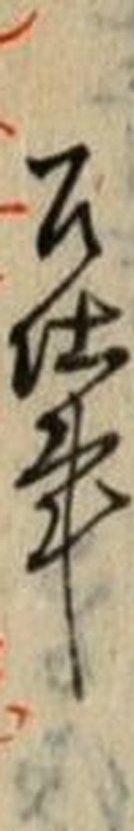召仕事
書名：養子縁組之部
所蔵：福井県文書館 Fukui Prefectural Archives
